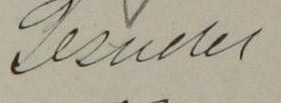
Gesuche
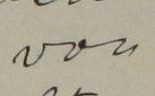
von
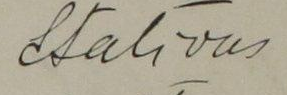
Stations
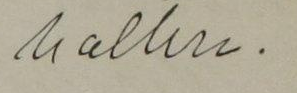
haltern.
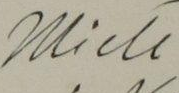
Miete
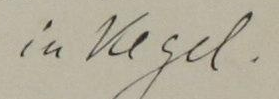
in Kegel.
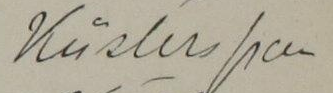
Küstersfrau
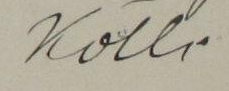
Kotli
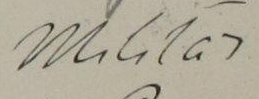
Militär
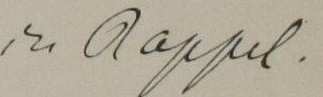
in Rappel.
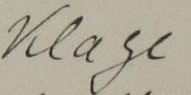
Klage
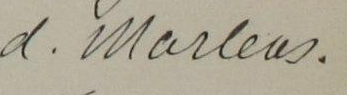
d. Martens.
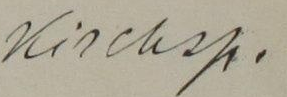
Kirchsp.
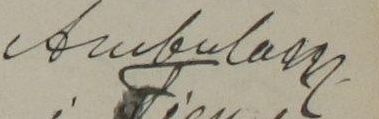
Ambulanz
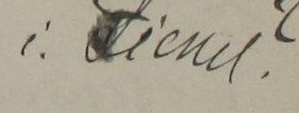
i. Fickel.
